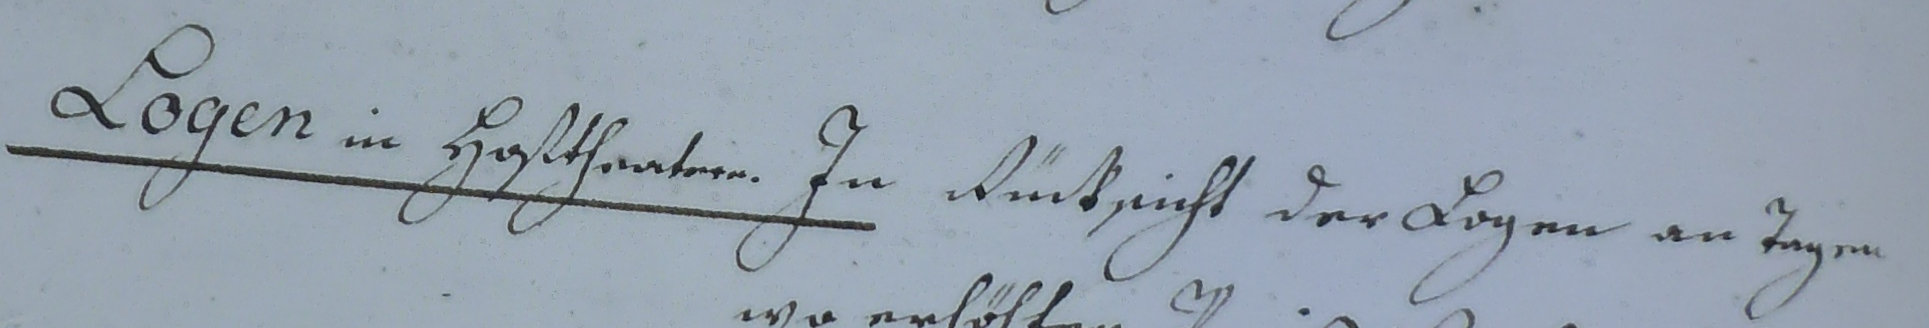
Logen in Hoftheatern. In Rücksicht der Logen an Tagen
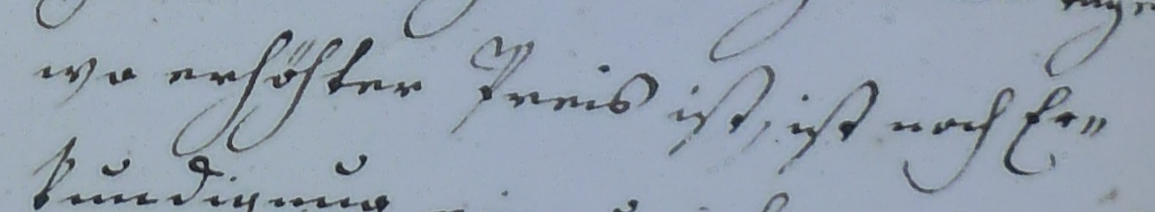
wo erhöhter Preis ist, ist nach Er¬
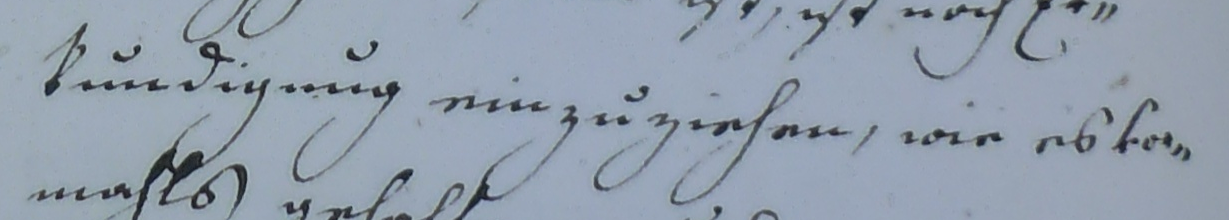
kundigung einzuziehen, wie es vor¬
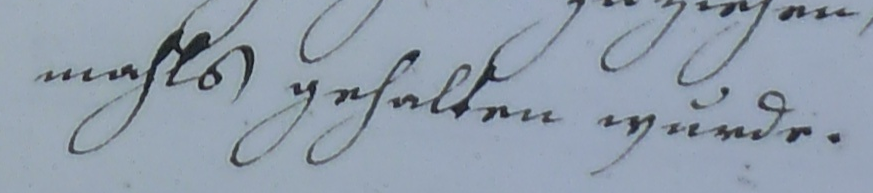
mahls gehalten wurde.
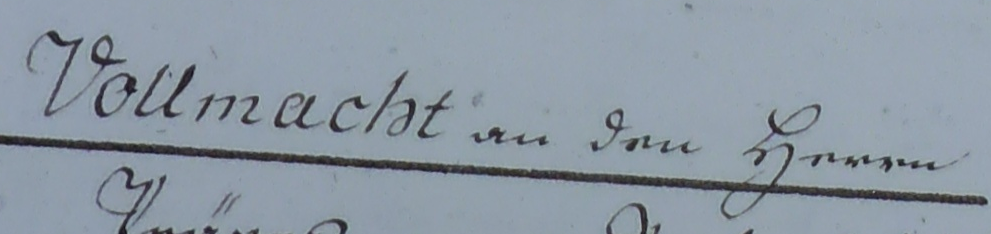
Vollmacht an den Herrn
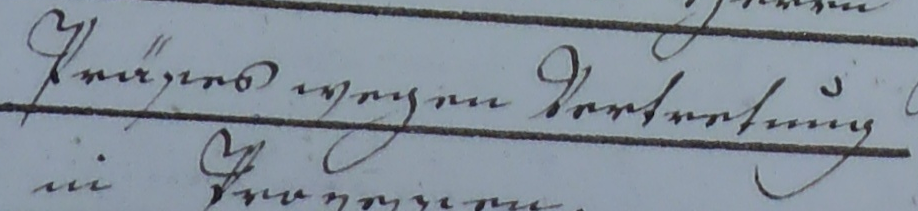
Präses wegen Vertretung
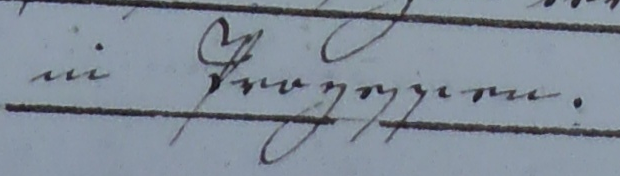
in Prozessen.
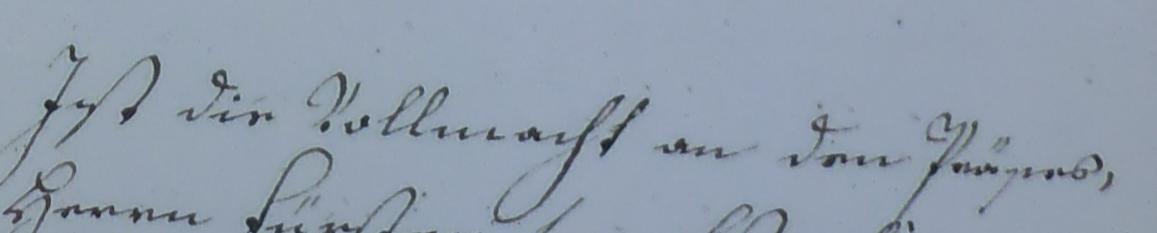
Ist die Vollmacht an den Präses,
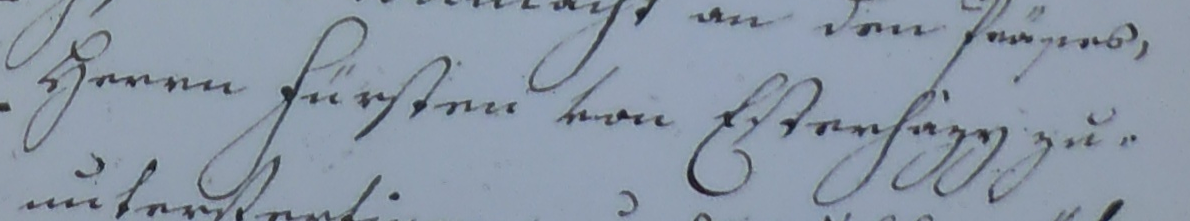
Herrn Fürsten von Esterhàzy zu¬
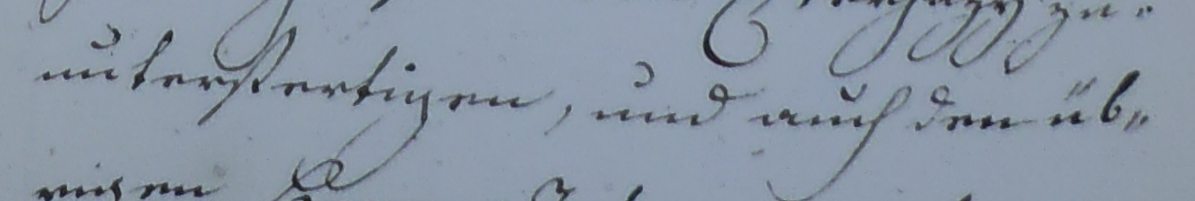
unterfertigen, und auch den üb¬
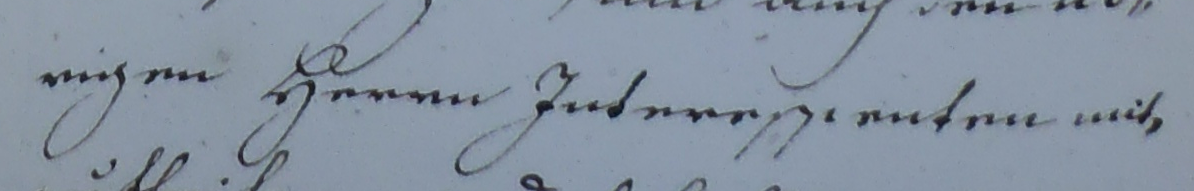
rigen Herrn Interessenten mit¬
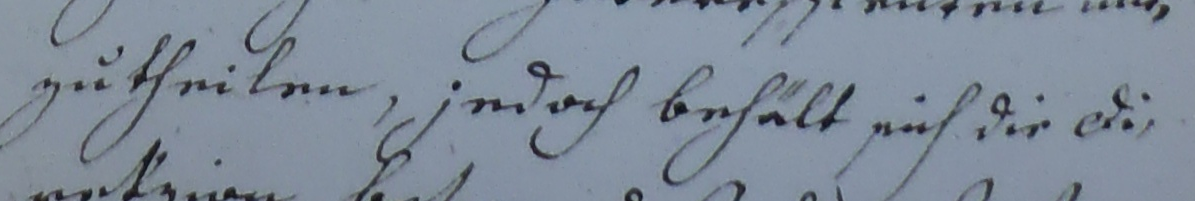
zutheilen, jedoch behält sich die Di¬
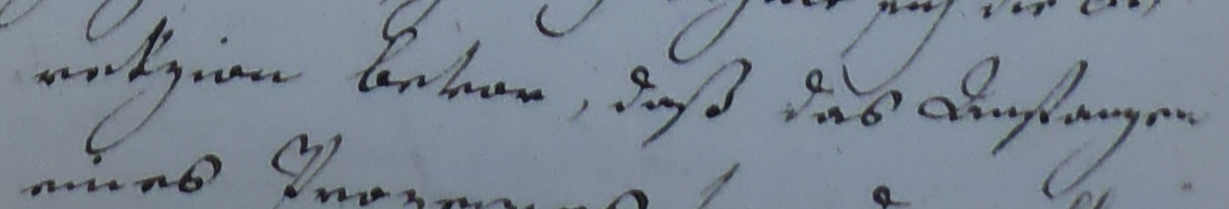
rekzion bevor, daß das Anfangen
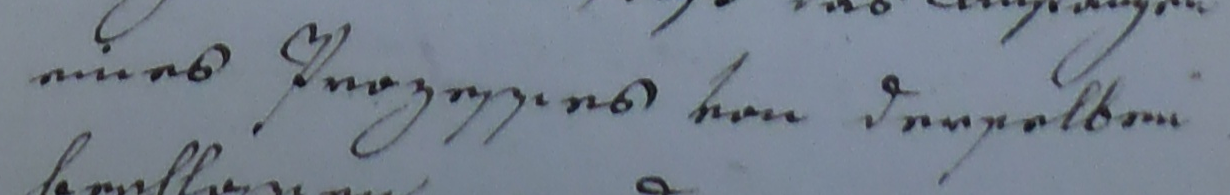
eines Prozesses von derselben
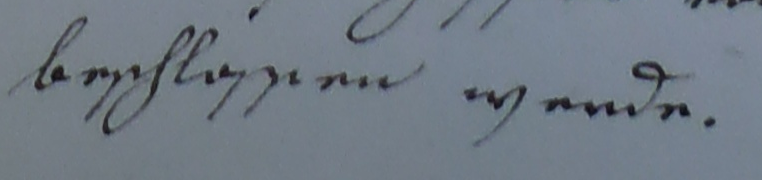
beschlossen werde.
